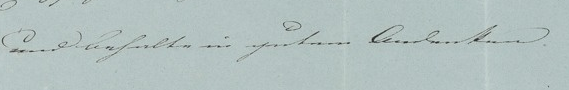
und behalte in gutem Andenken.
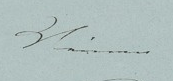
Deinen
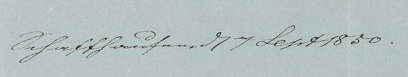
Schaffhausen den 7 Sept 1850.
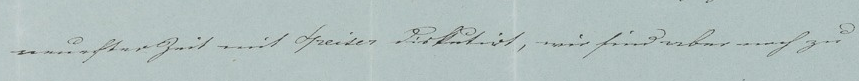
neuester Zeit mit Speiser diskutirt, wir sind aber noch zu
